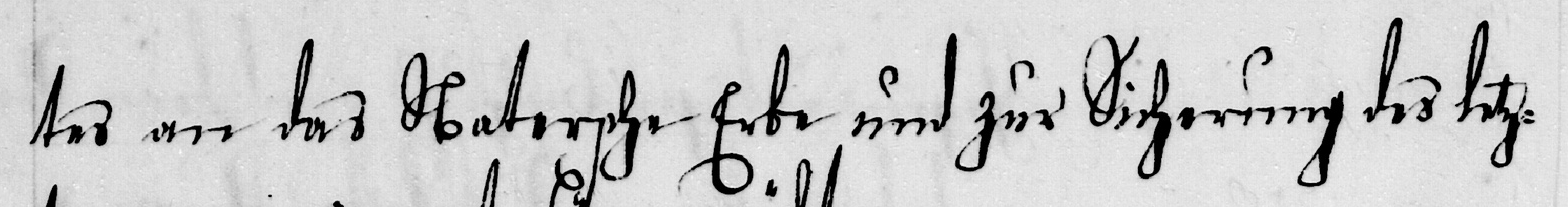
tes an das Natersche Erbe und zur Sicherung des letz¬
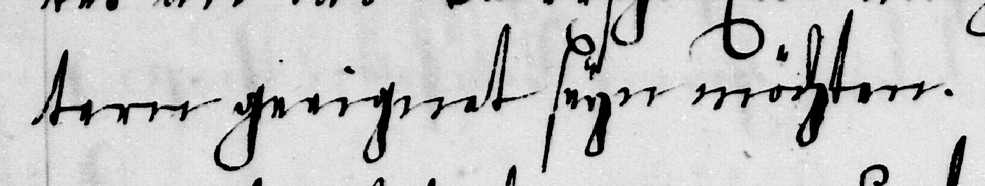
tern geeignet seyn möchten.
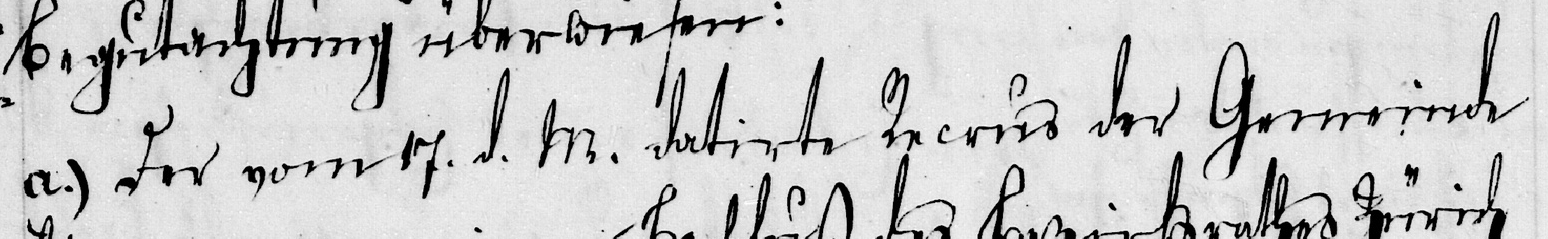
a.) Der vom 17. d. M. datirte Recurs der Gemeinde
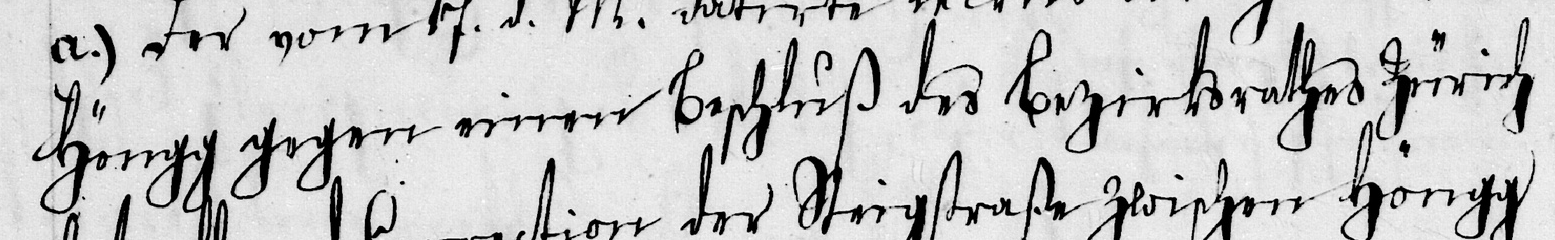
Höngg gegen einen Beschluß des Bezirksrathes Zürich
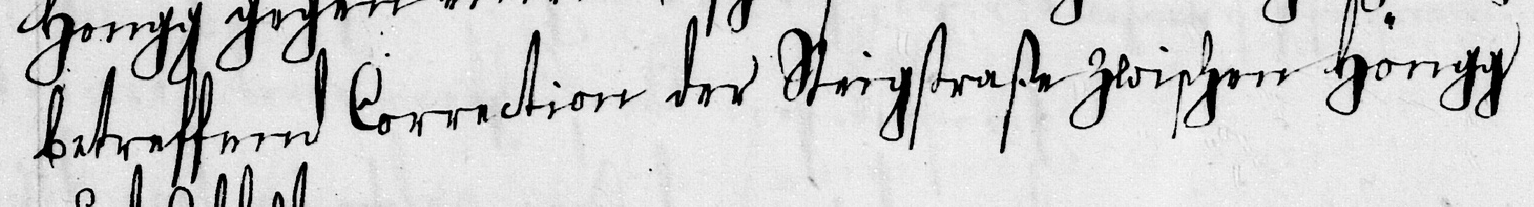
betreffend Correction der Steigstraße zwischen Höngg
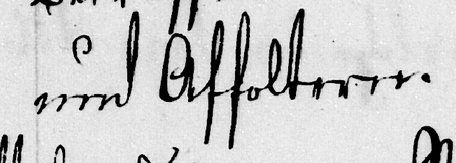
und Affoltern.
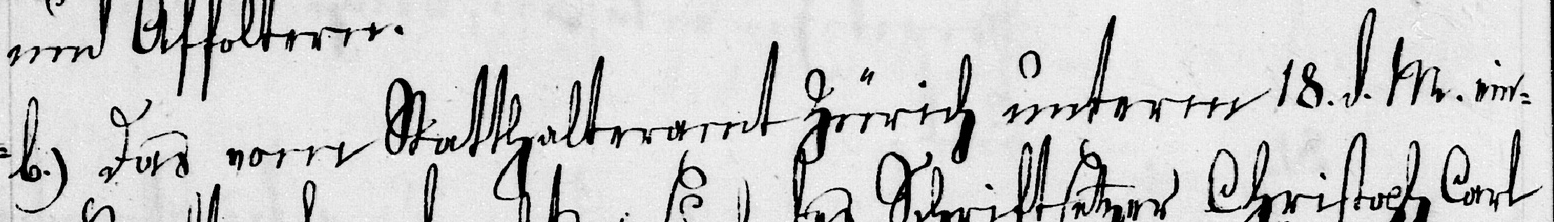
b.) Das vom Statthalteramt Zürich unterm 18. d. M. ein¬
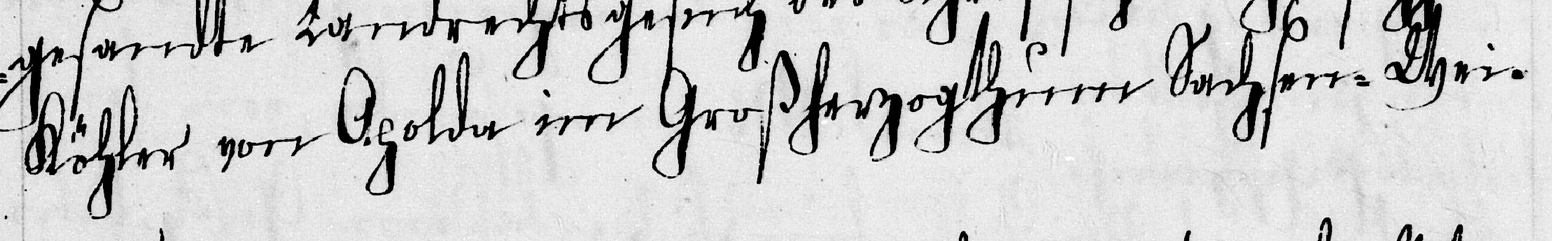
Köhler von Apolda im Großherzogthum Sachsen-Wei¬
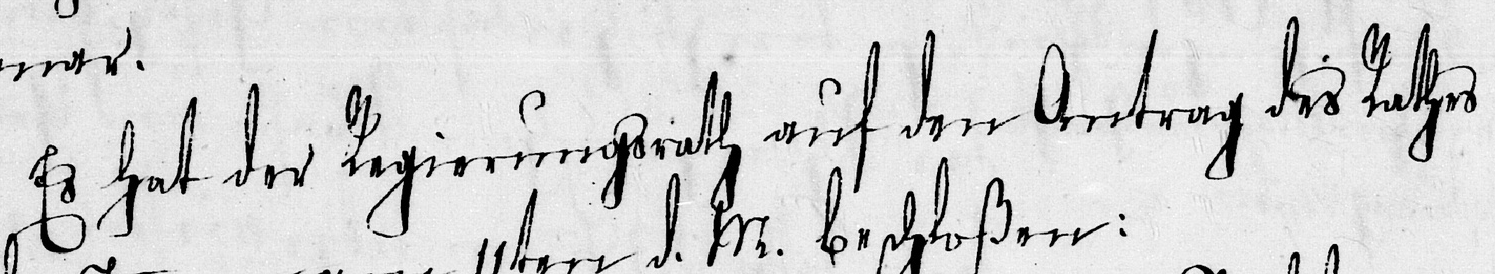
Es hat der Regierungsrath auf den Antrag des Rathes
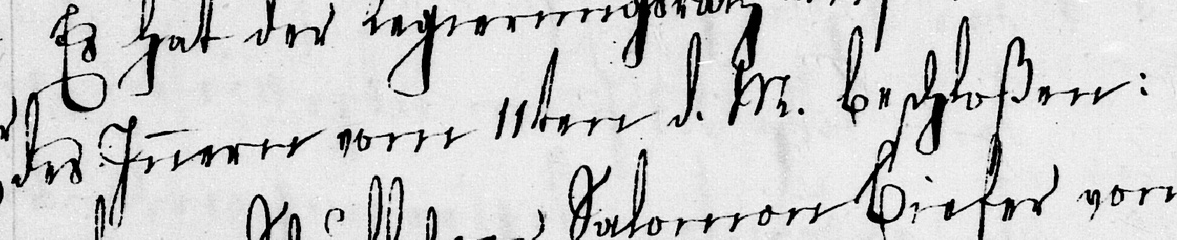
des Innern vom 11ten d. M. beschloßen:
